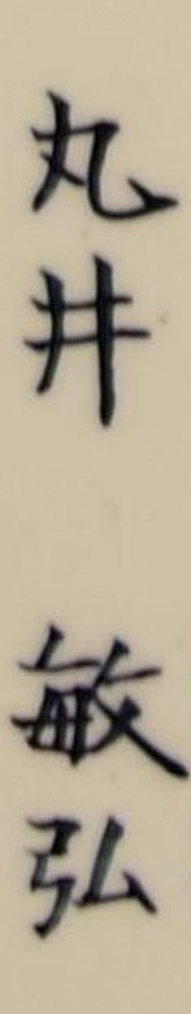丸井敏弘
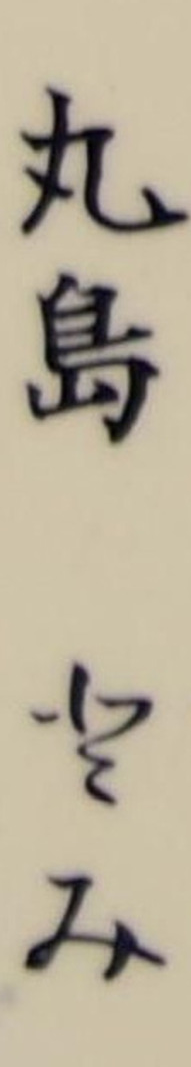丸島とみ
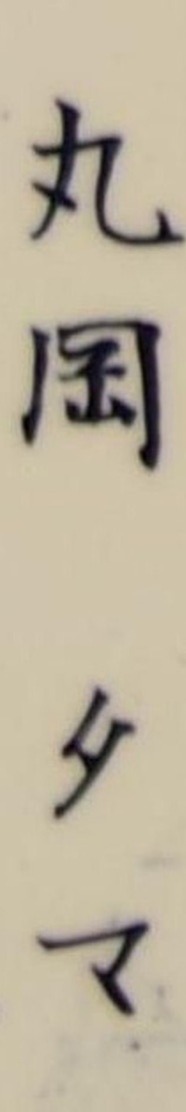丸岡タマ
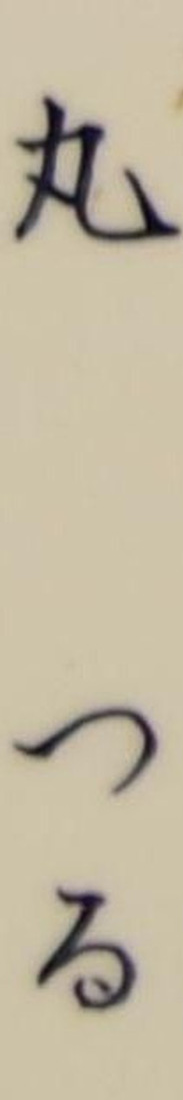丸つる
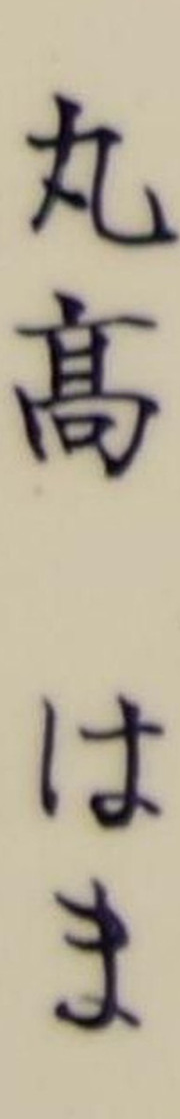丸高はま
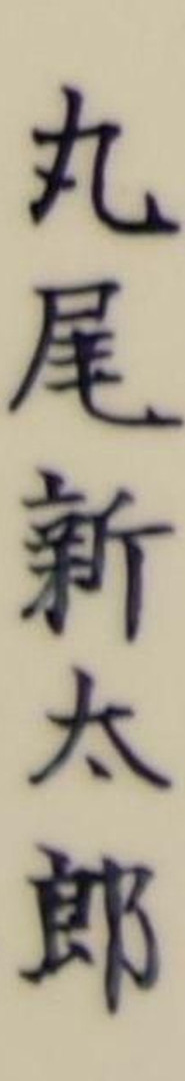丸尾新太郎
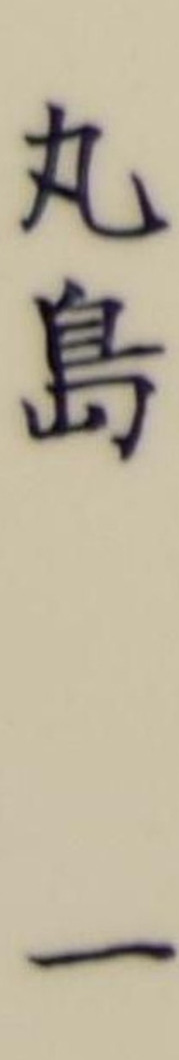丸島一
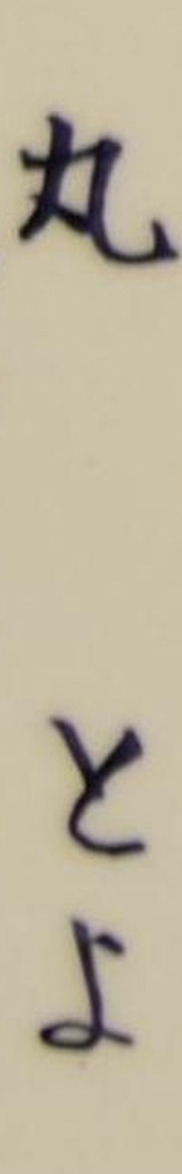丸とよ
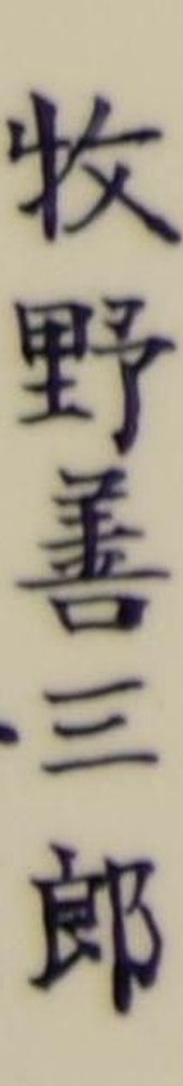牧野善三郎

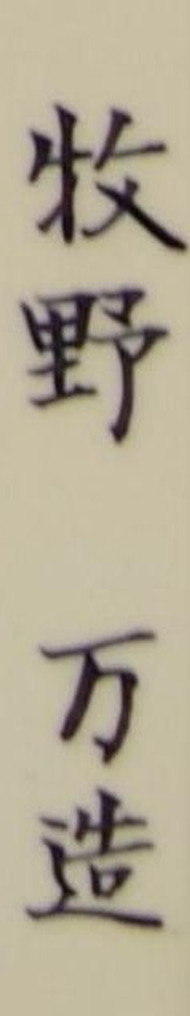牧野万造
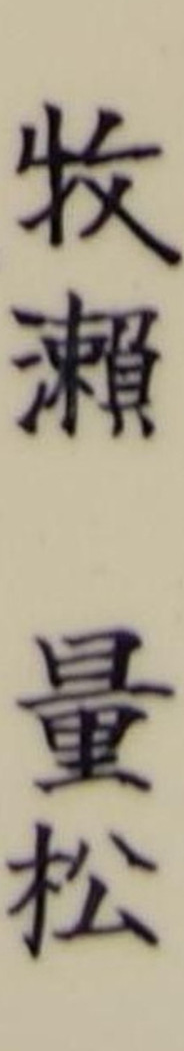牧瀬量松
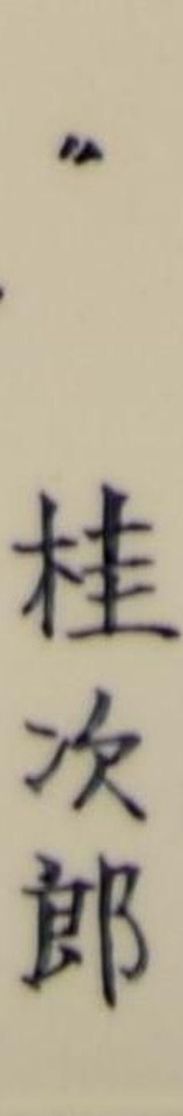桂次郎
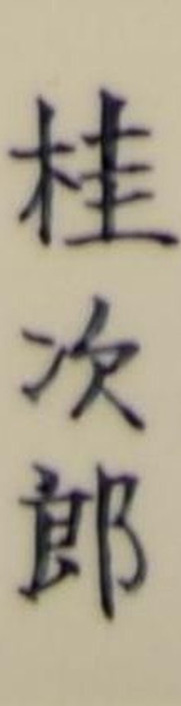桂次郎
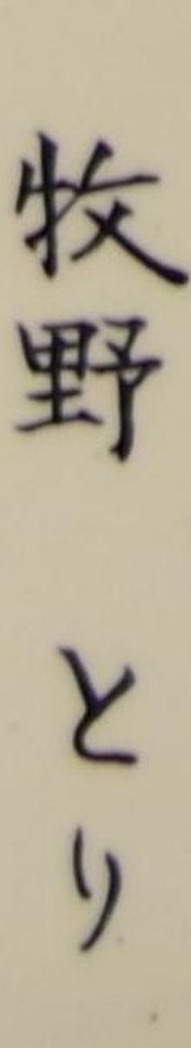牧野とり
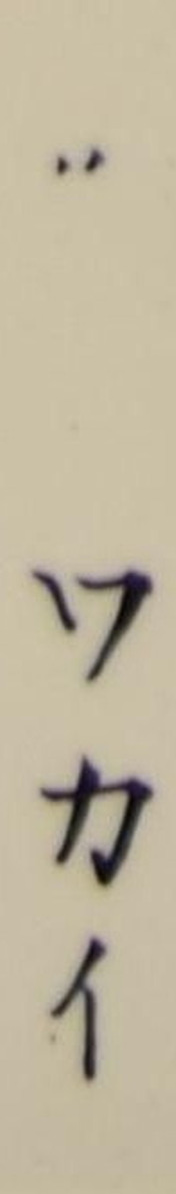ワカイ
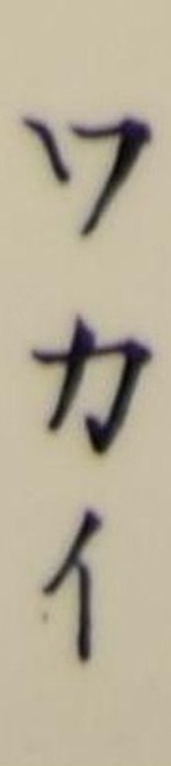ワカイ
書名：A~D
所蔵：koyasan kongobuji
